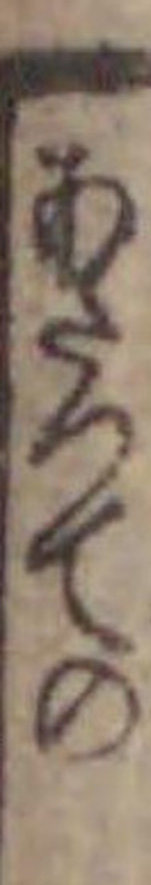あたつての

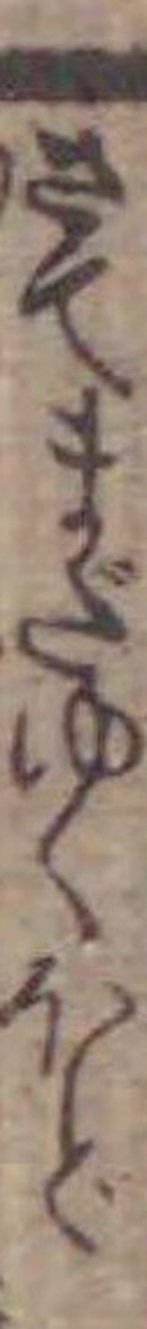さてまだゆくほど
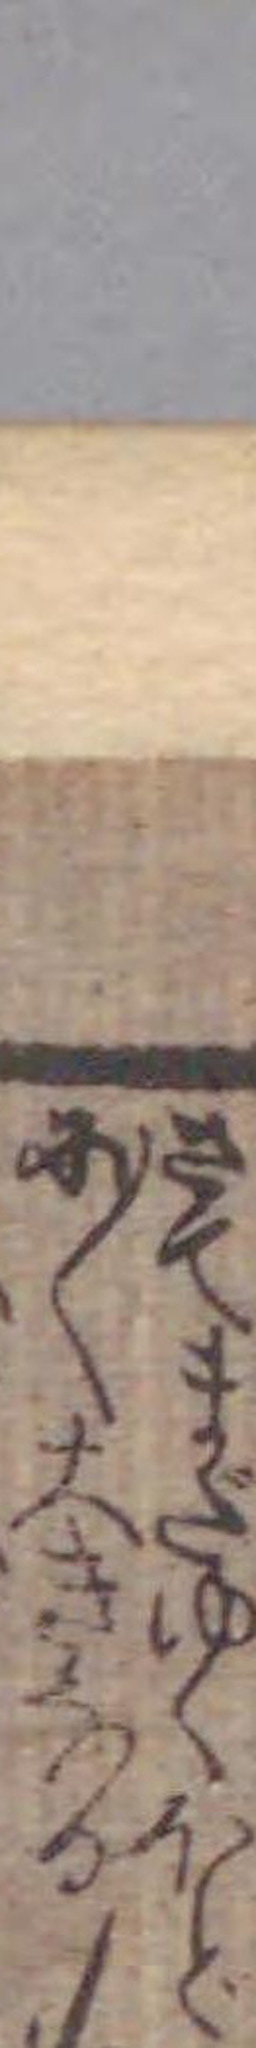に〳〵大きなる
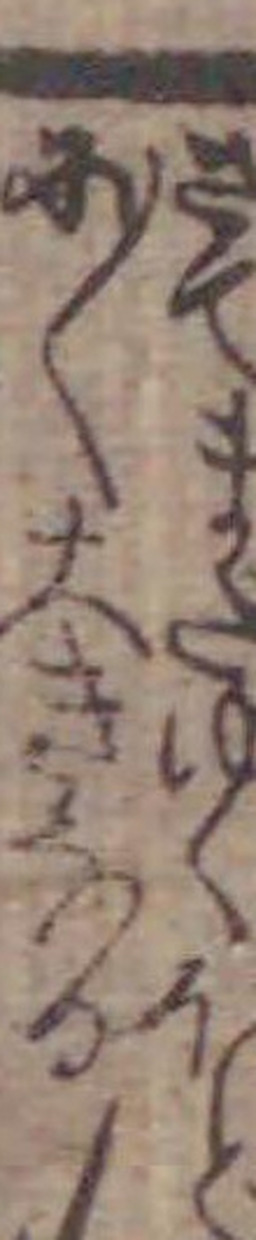に〳〵大きなる
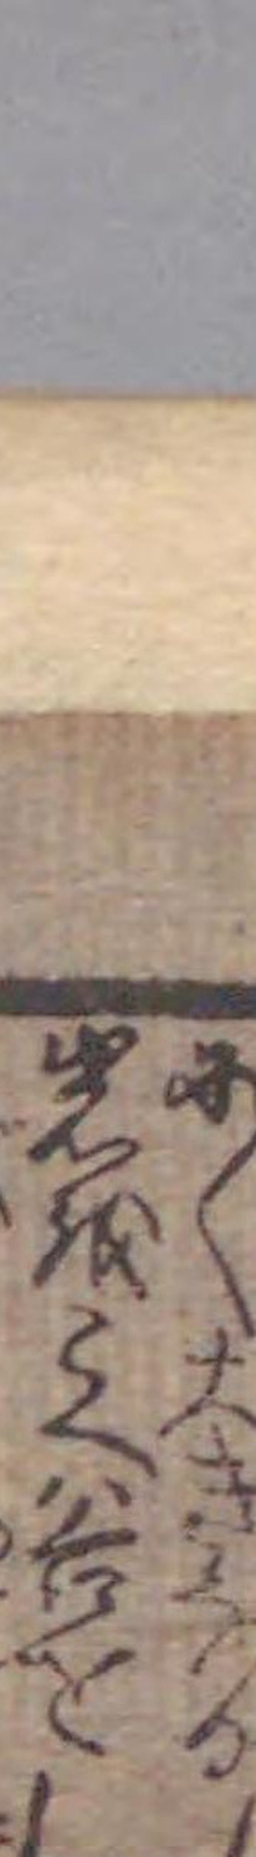岩をこへ谷を
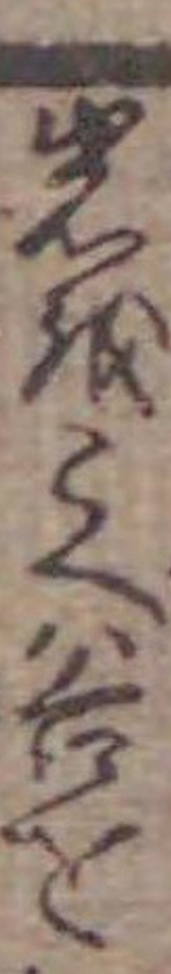岩をこへ谷を
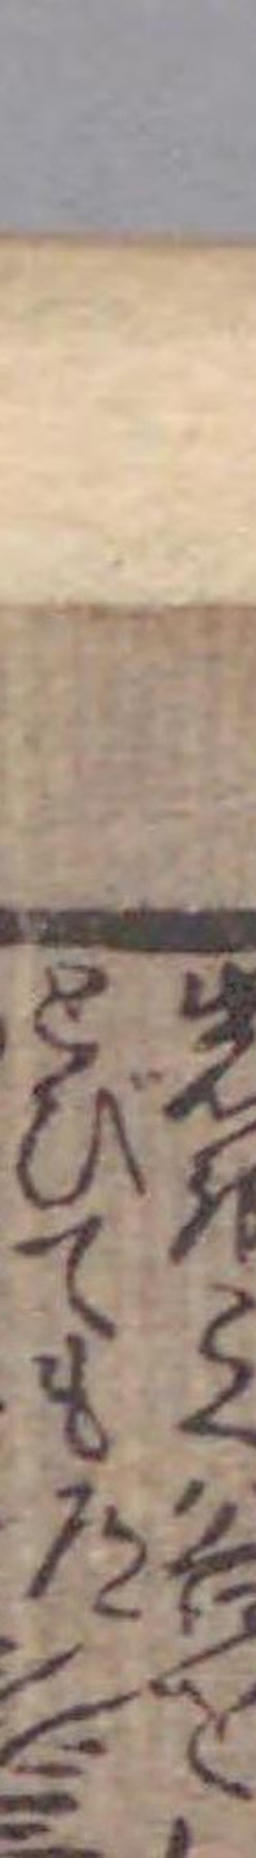とびても道
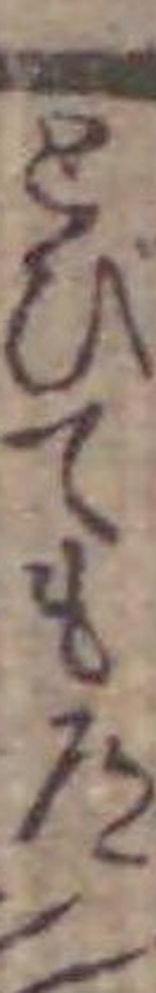とびても道
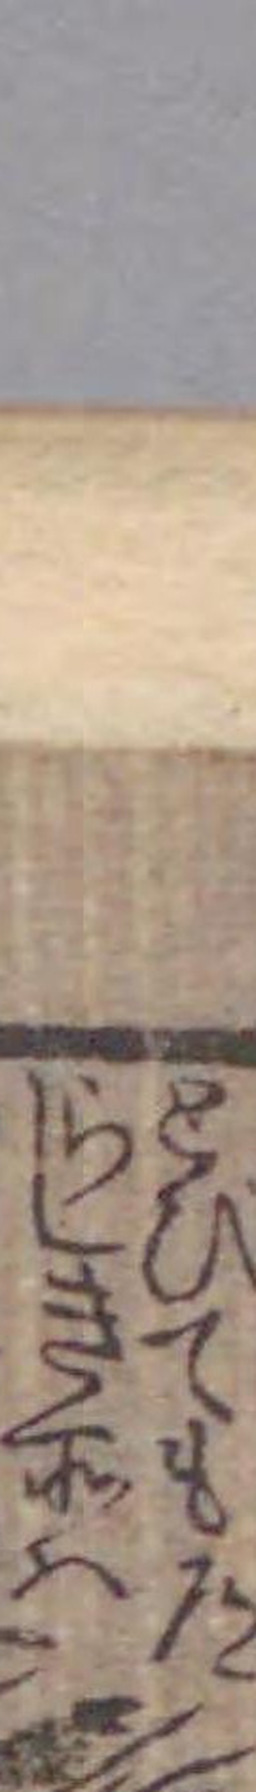らしき所は
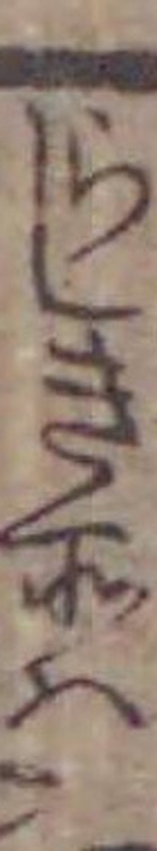らしき所は
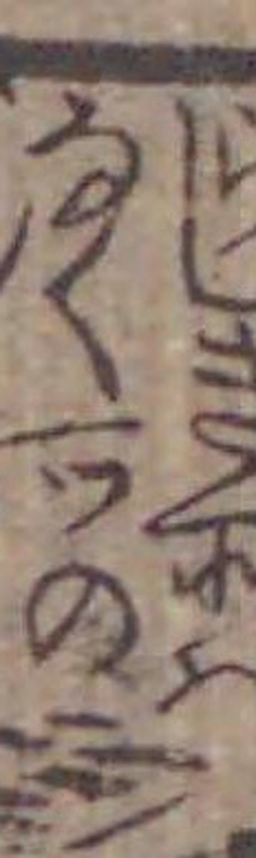なく一つの
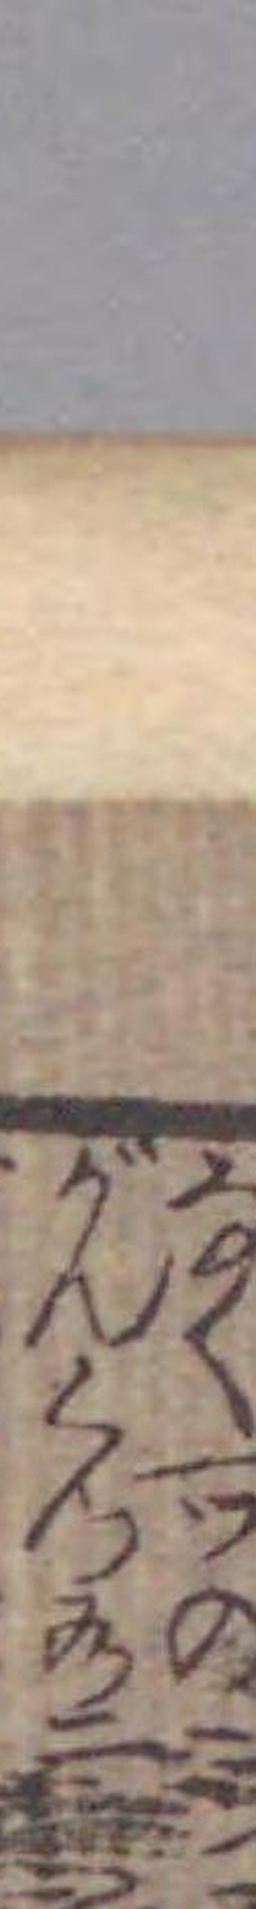がんくつ道
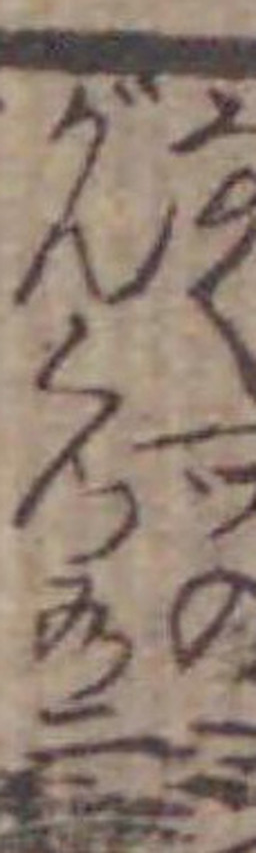がんくつ道
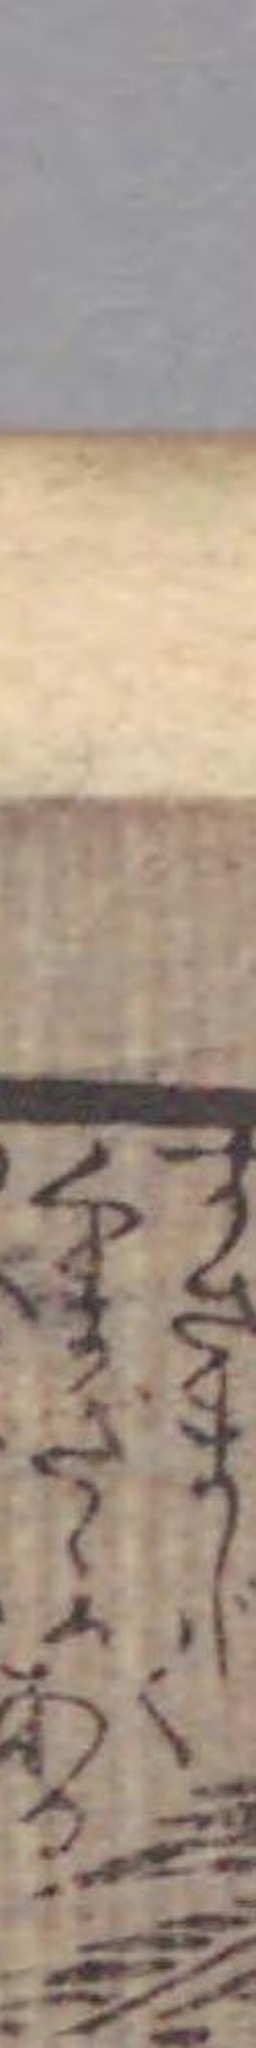くまざゝかある
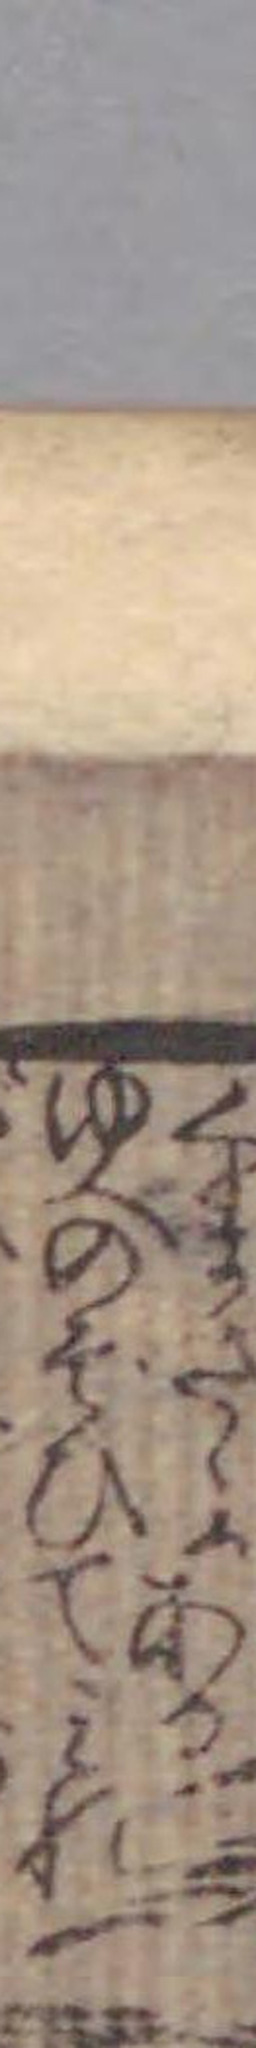ゆへのぞひてみれ
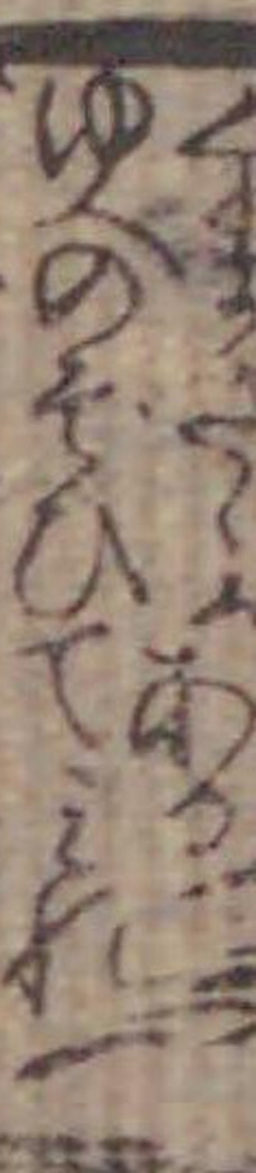ゆへのぞひてみれ
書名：即席耳学問 : 3巻
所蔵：国立国会図書館 National Diet Library, JAPAN
